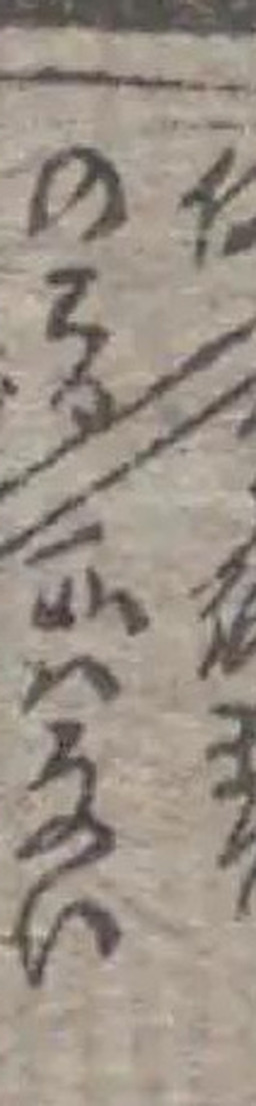のこる所はない
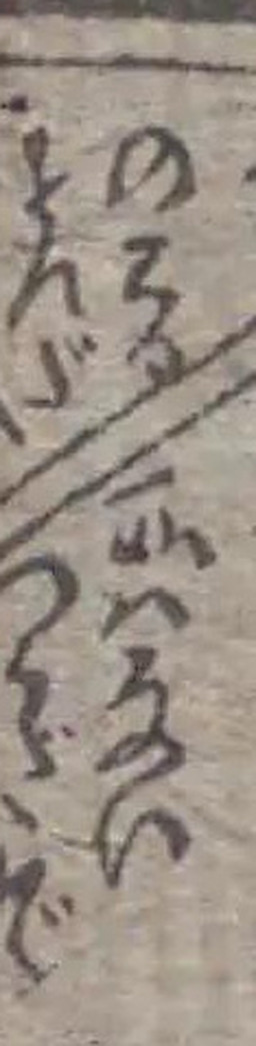のこる所はない
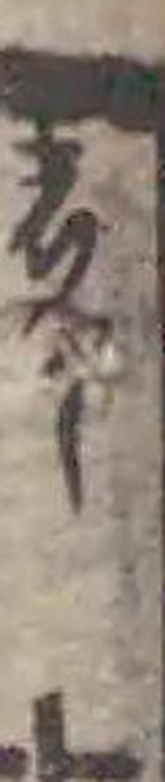しかし
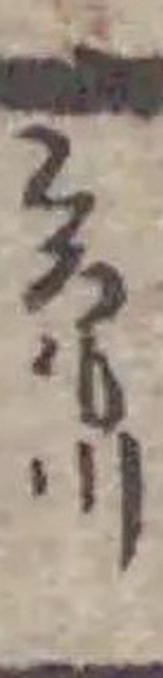ころも川
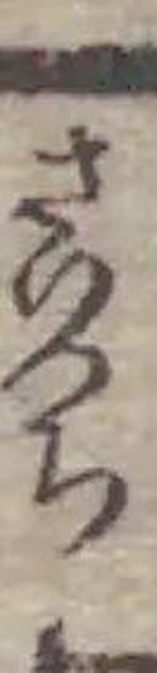さいつち
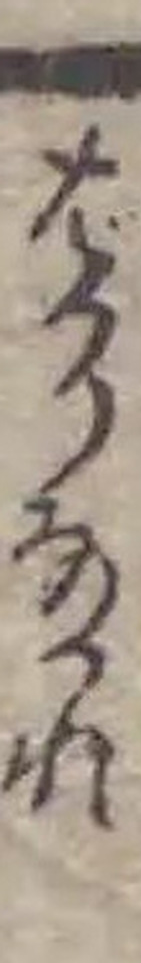はかりなかれ
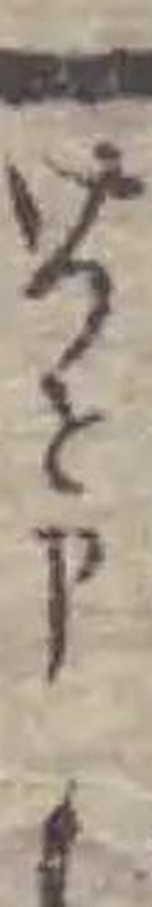けりと申
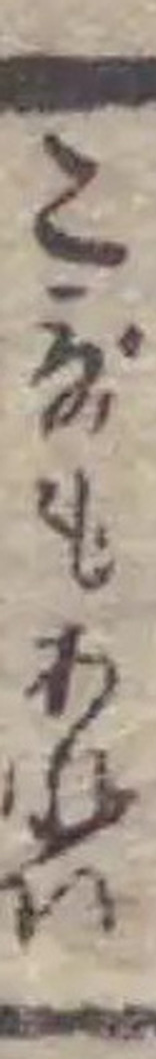こ度もあれは
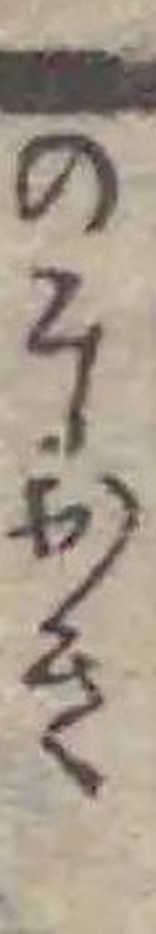のこしおき
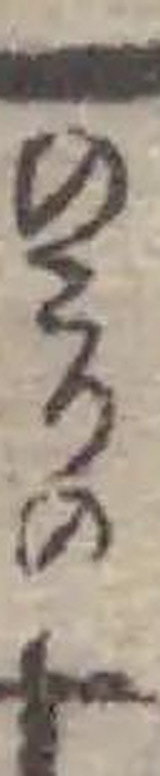のこりの
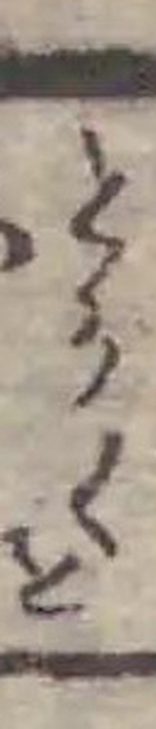とうくを
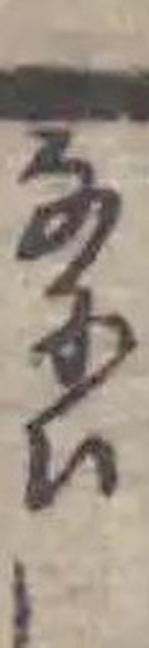なには
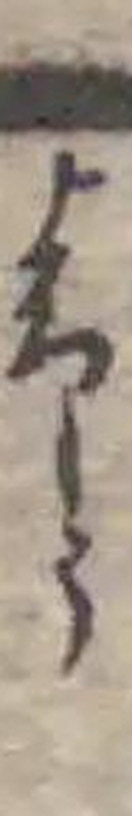よろしう
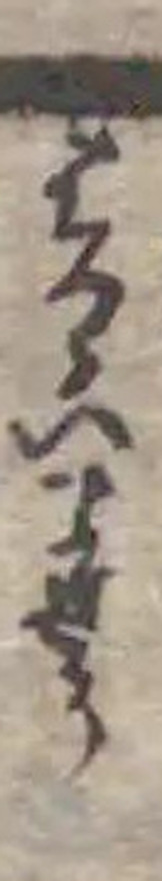はからいませう

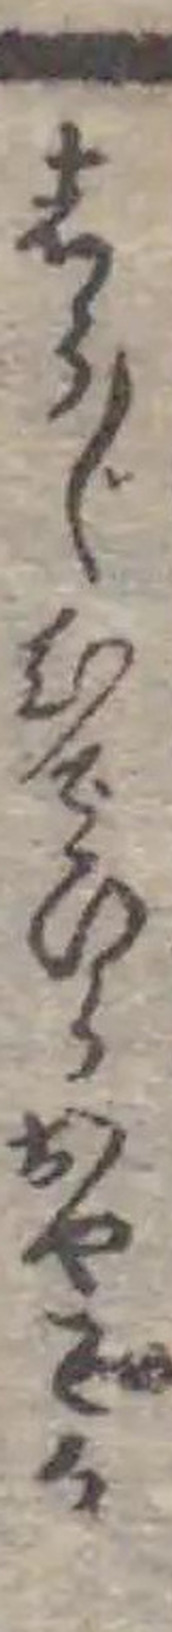しう〴〵ひでひらおやこか
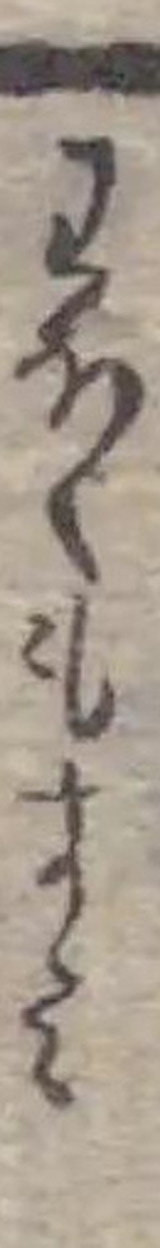わほくもすみ
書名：通増安宅関 2巻
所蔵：国立国会図書館 National Diet Library, JAPAN
